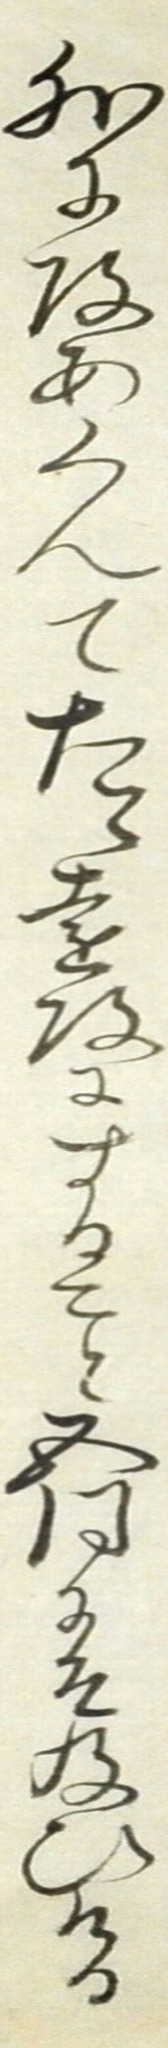外に攻あくんてた遠攻にすること五月にそ及ひける
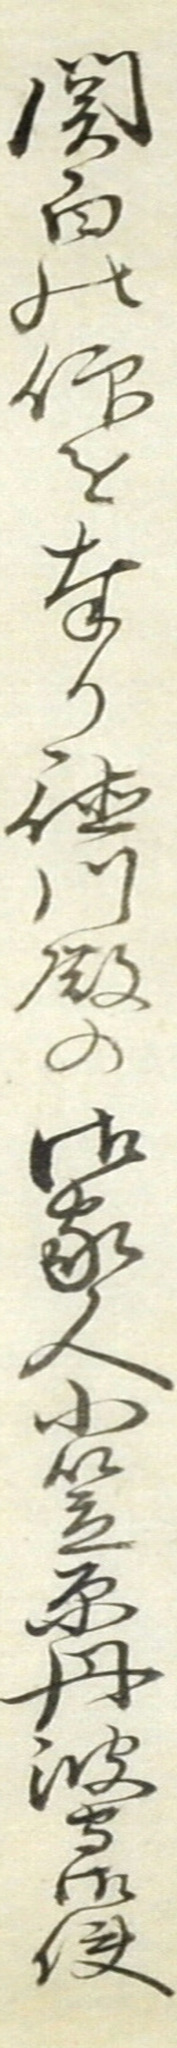関白の仰を奉り徳川殿の御家人小笠原丹波守御使
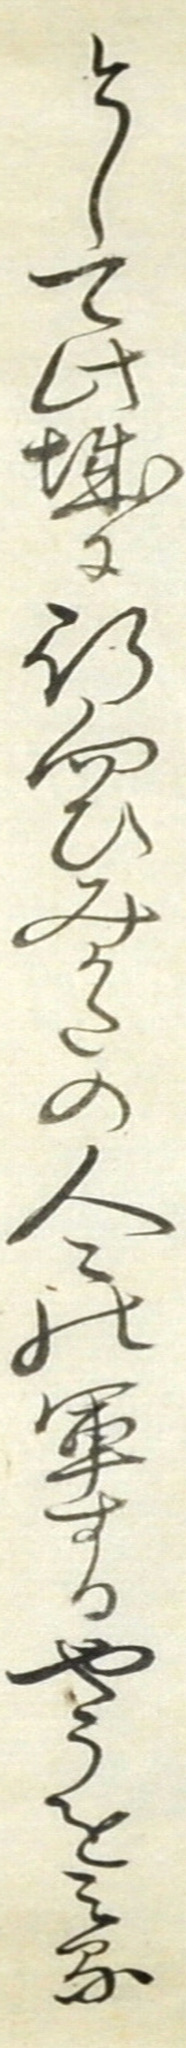として此城に行向ひみかたの人々の軍するやうをみる
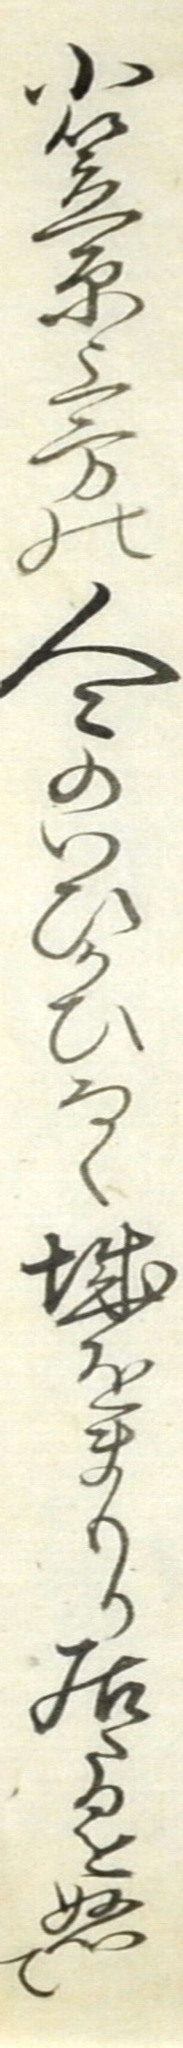小笠原上方の人々のいひかひなく城をまもり居たるを怒て
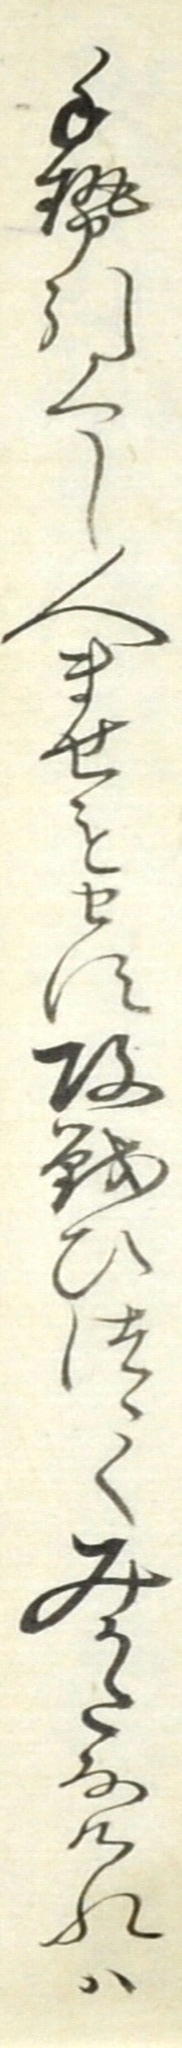手勢引くし人ませもせす攻戦ひつゝくみかたなけれは
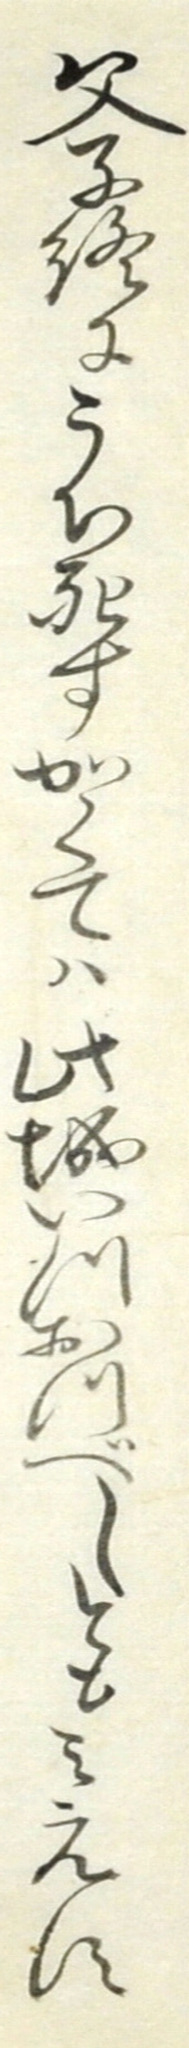父子終にうち死すかくては此城いつおつべしともみえす
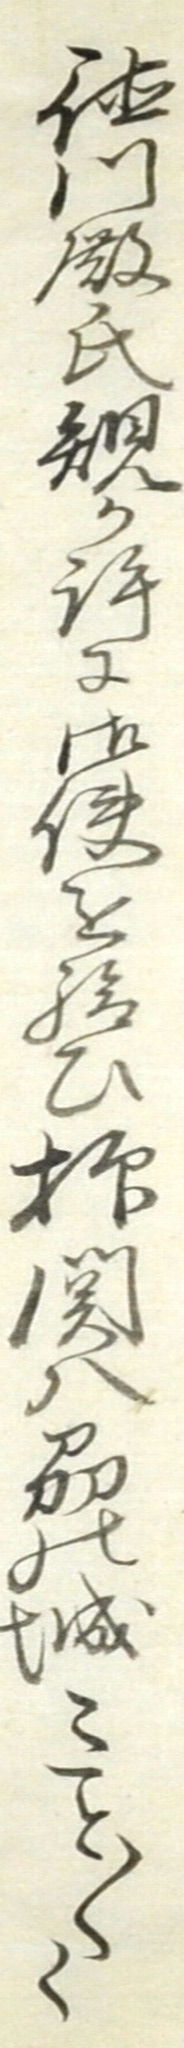徳川殿氏規か許に御使を給ひ抑関八州の城々こと〳〵く
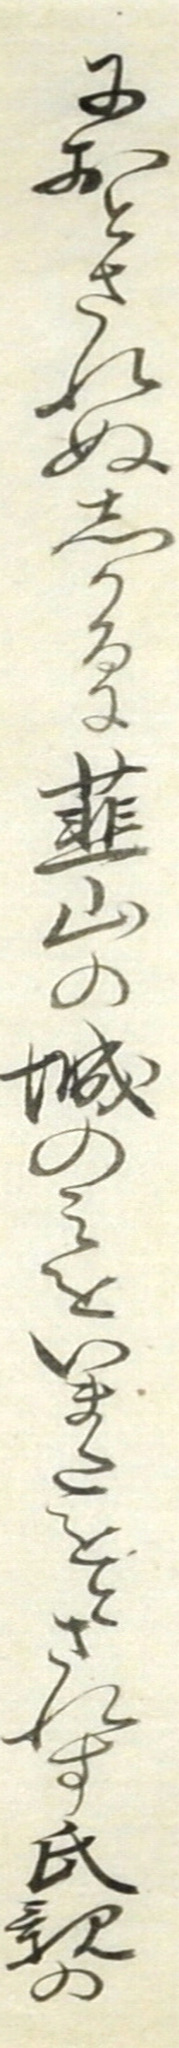におとされぬしかるに韮山の城のみをいまたをとされす氏親の
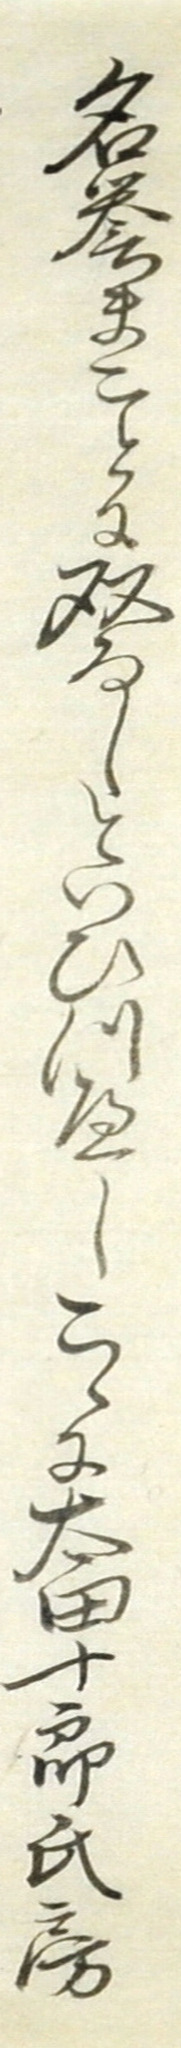名誉まことに双なしといひつへしこゝに太田十郎氏房
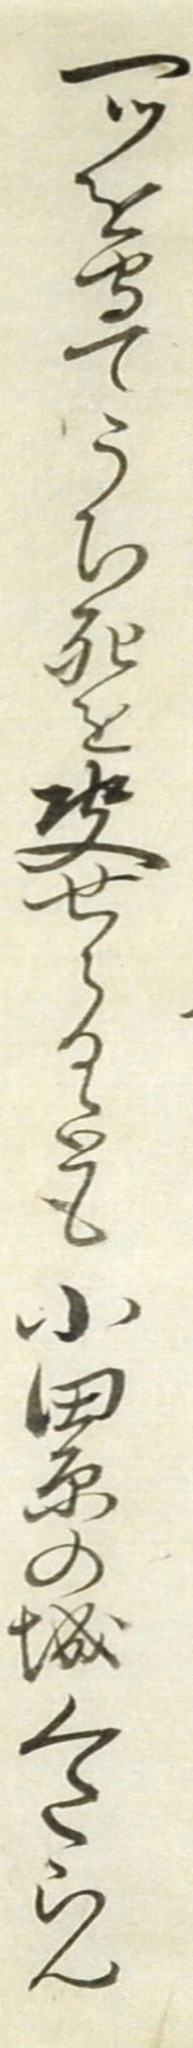一ッを守てうち死を決せらるゝとも小田原の城くたらん
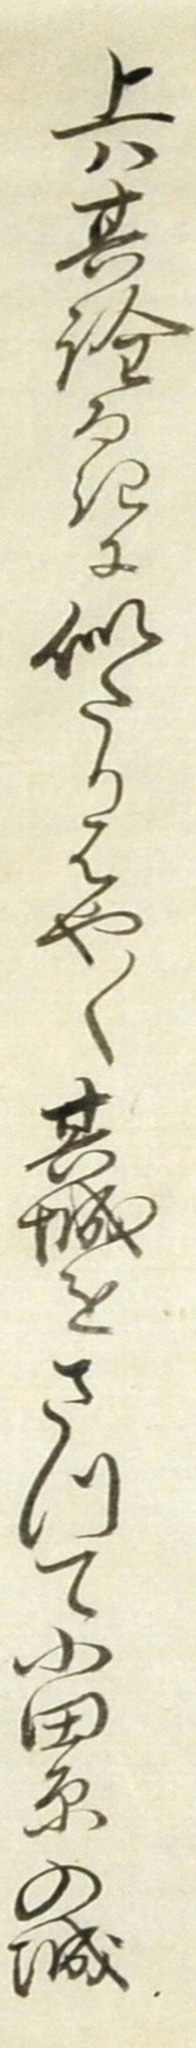上は其詮なきに似たりはや〳〵其城をさつて小田原の城
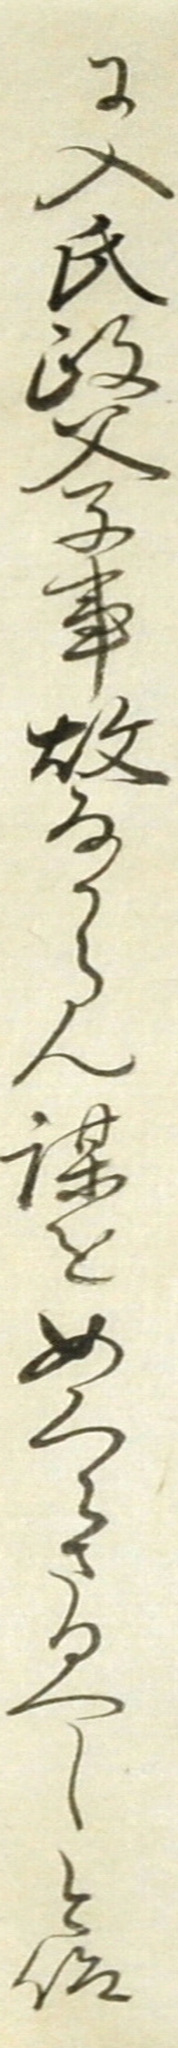に入氏政父子事故なからん謀をめくらさるへしと仰
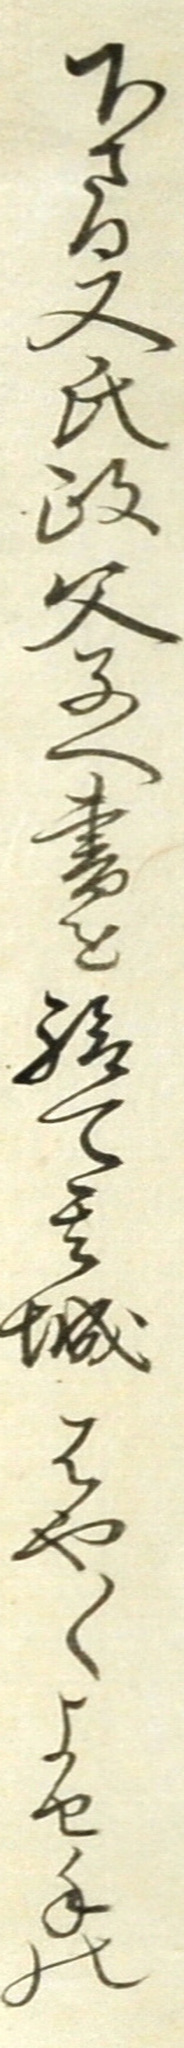下さる又氏政父子へ書を給て其城はやくよせ手の

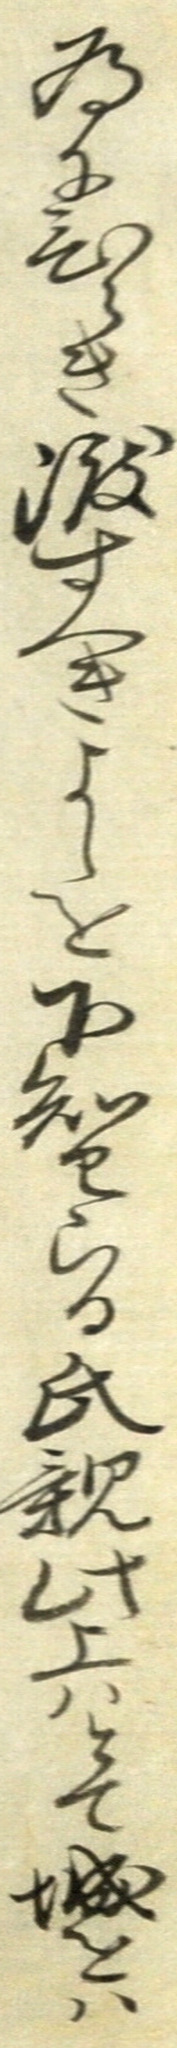為にひらき渡すへきよしを下知せらる氏親此上はとて城をは
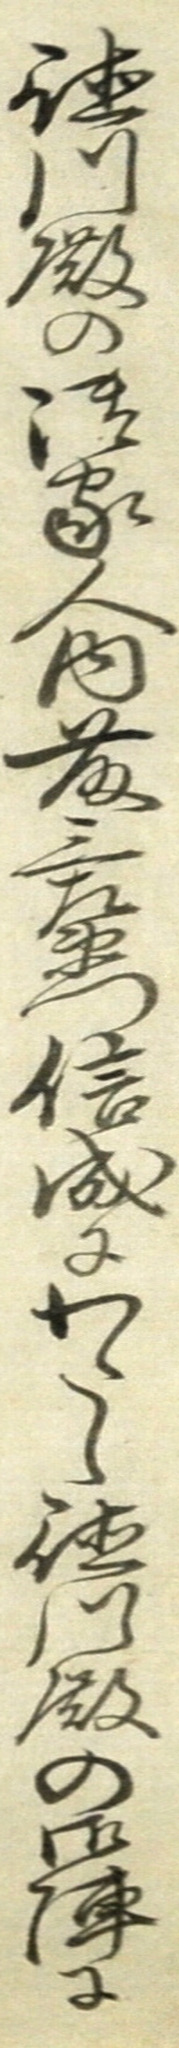徳川殿の御家人内藤三左衛門信成にわたし徳川殿の御陣に
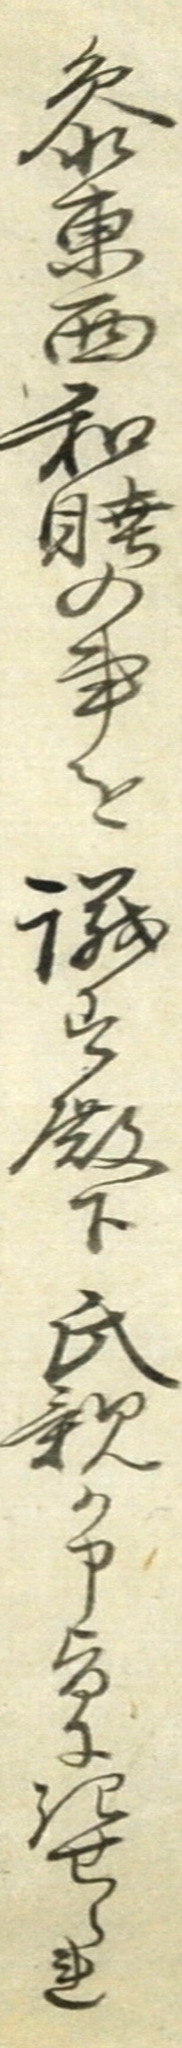参東西和睦の事を議す殿下氏親か申旨に記せられ
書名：藩翰譜（六）
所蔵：伊那市立高遠町図書館・合同会社AMANE
